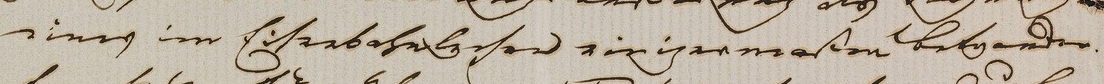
eines im Eisenbahnwesen einigermassen bewander-
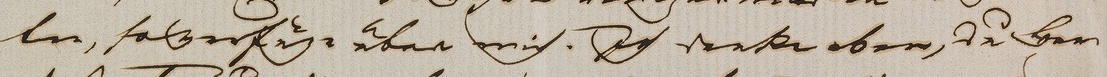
ten, so verfüge über mich. Ich denke aber, Du wer-
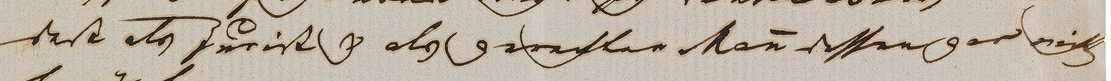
dest als Jurist & als gerechter Mann dessen gar nicht
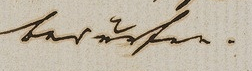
bedürfen.
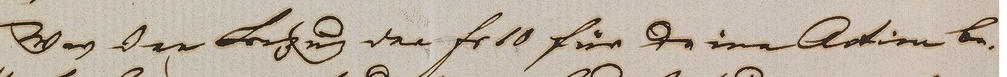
Was den Bezug der Fr 10 für Deine Actien be-
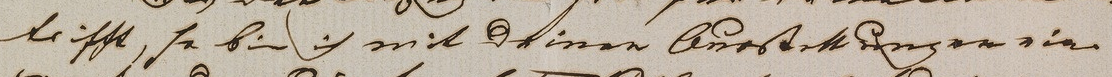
trifft, so bin ich mit Deinen Ausstellungen ein-
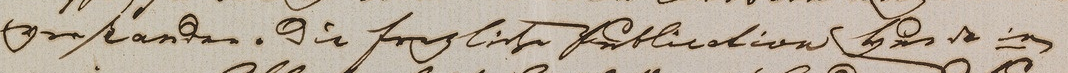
verstanden. Die fragliche Publication wurde in
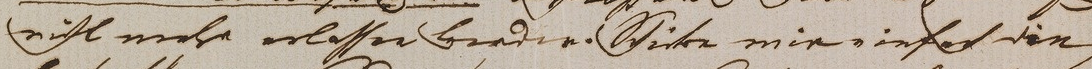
nicht mehr erlassen werden. Schicke mir einfach die
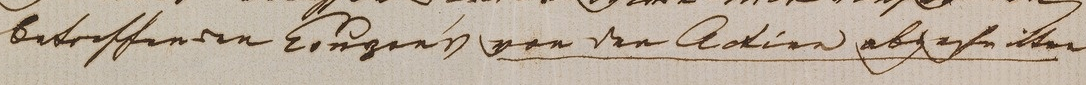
betreffenden Coupon's von den Actien abgeschnitten
